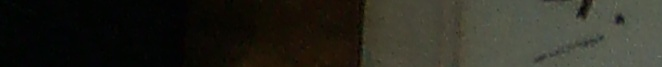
­­4.
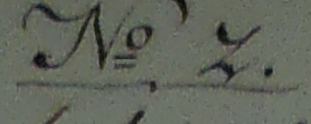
No͇ 2.
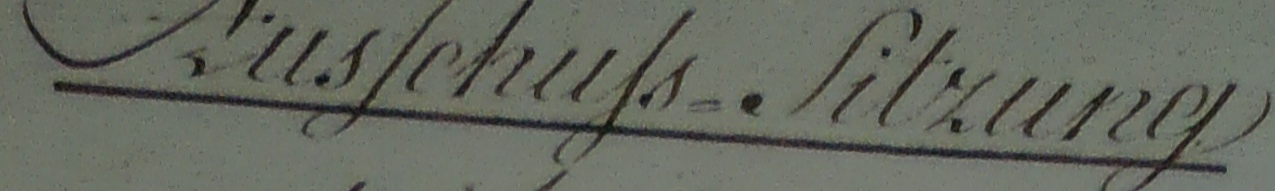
Ausschuss‗Sitzung
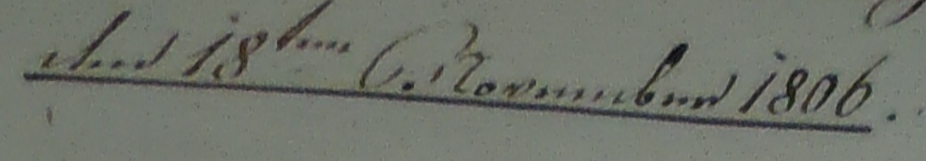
den 18ten November 1806.
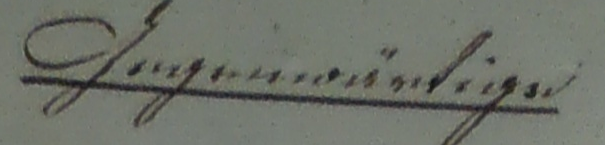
Gegenwärtige
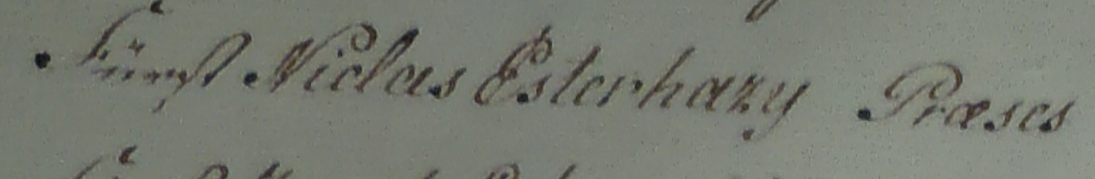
Fürst Niclas Esterhazy Præses
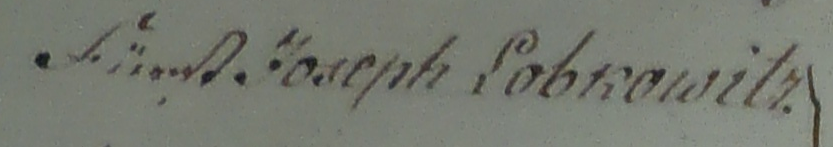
Fürst Joseph Lobkowitz
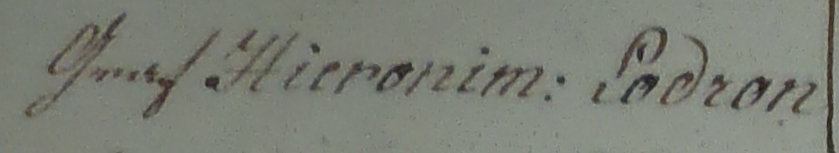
Graf Hieronim: Lodron
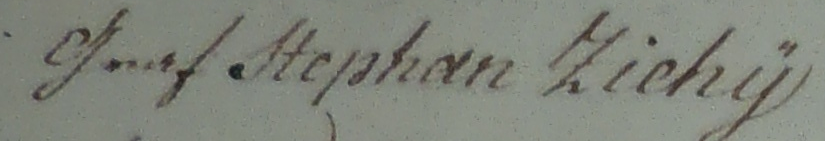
Graf Stephan Zichy
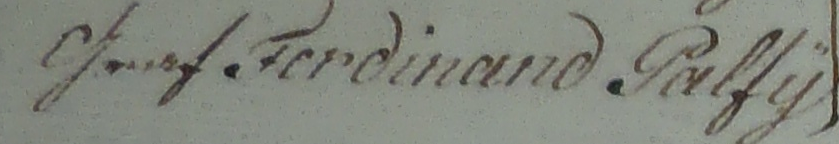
Graf Ferdinand Palfy
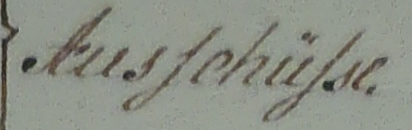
Ausschüsse.
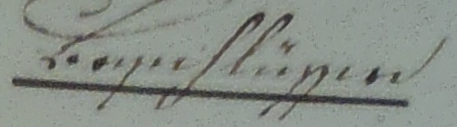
Beschlüsse.
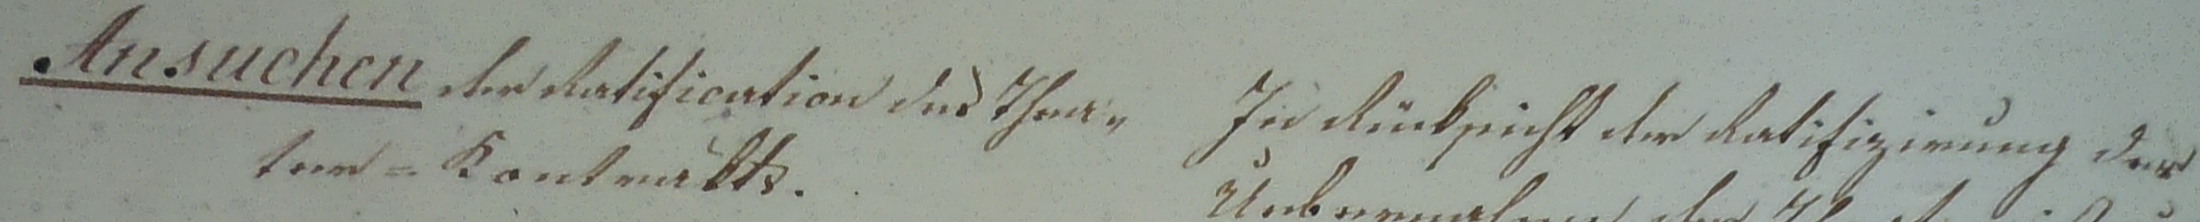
Ansuchen der Ratification des Thea¬
